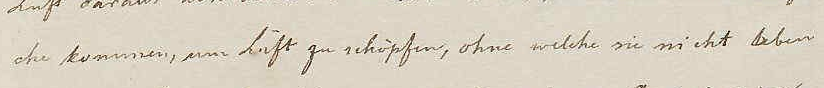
che kommen, um Luft zu schöpfen, ohne welche sie nicht leben
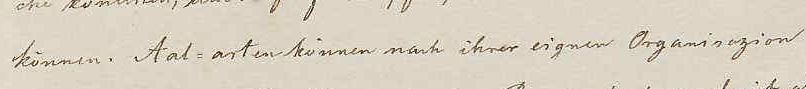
können. Aal-arten können nach ihrer eignen Organisazion
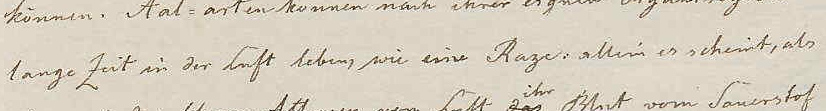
lange Zeit in der Luft leben, wie eine Raze: allein es scheint, als
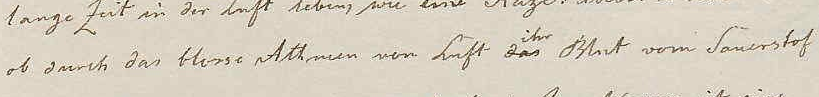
ob durch das blosse Athmen von Luft dasihr Blut vom Sauerstof
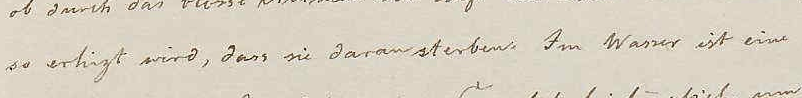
so erhizt wird, dass sie daran sterben. Im Wasser ist eine
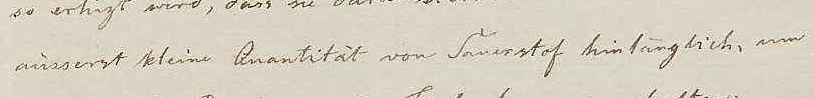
äusserst kleine Quantität von Sauerstof hinlänglich, um
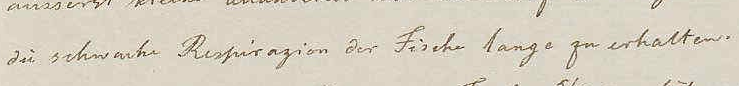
die schwache Respirazion der Fische lange zu erhalten.
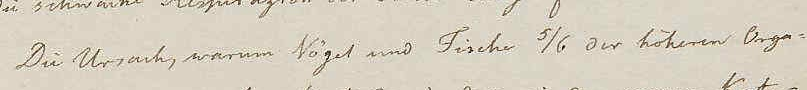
Die Ursach, warum Vögel und Fische ⅚ der höheren Orga-
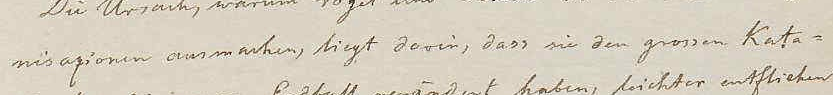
nisazionen ausmachen, liegt darin, dass sie den grossen Kata-
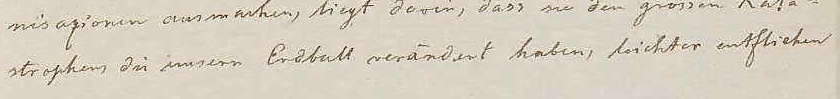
strophen, die unsern Erdball verändert haben, leichter entfliehen
